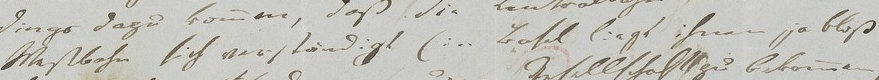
Westbahn sich verständigt (in Basel liegt ihnen ja bloß
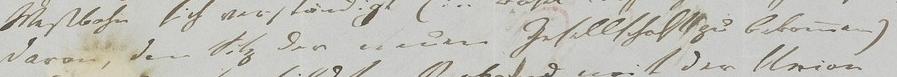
daran, den Sitz der neuen Gesellschaft zu bekommen)
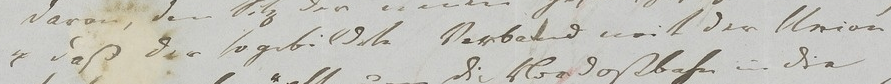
& daß der so gebildete Verband mit der Union
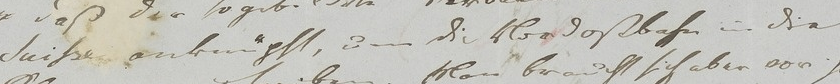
Suisse anknüpft, um die Nordostbahn in die
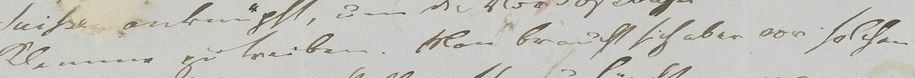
Klemme zu treiben. Man braucht sich aber vor solchen
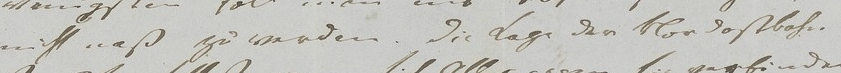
nicht naß zu werden. Die Lage der Nordostbahn
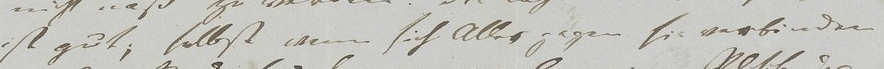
ist gut; selbst wenn sich Alles gegen sie verbinden
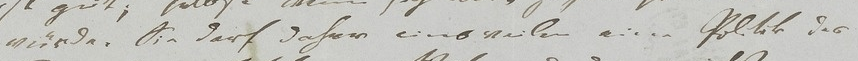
würde. Sie darf daher einsweilen eine Politik des
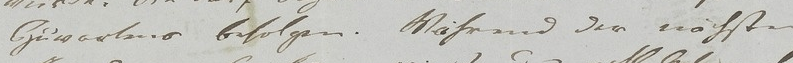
Zuwartens befolgen. Während der nächsten
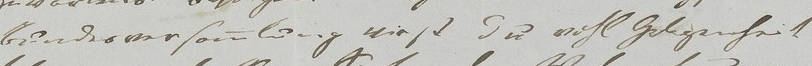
Bundesversammlung wirst du wohl Gelegenheit
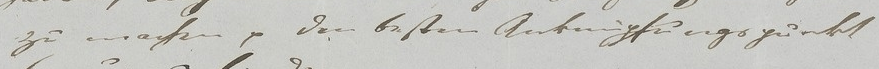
zu machen & den besten Anknüpfungspunkt
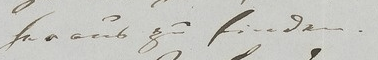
heraus zu finden.
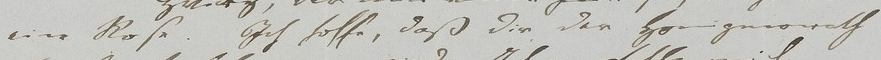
eine Rose. Ich hoffe, daß dir der Honigmonath
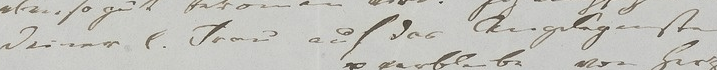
deiner l. Frau auf das Angelegenste
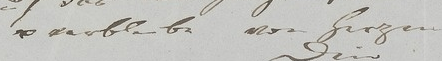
& verbleibe von Herzen
